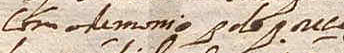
com o demonio pelo pouco
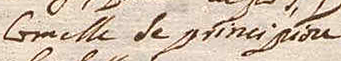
com elle se principiou
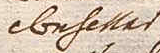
e Confessar
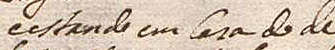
e estando em Caza do de
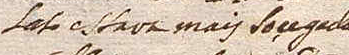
lato estava mais soçegada
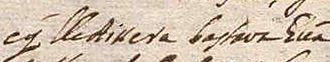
e q̄ lhe dissera bastava huā
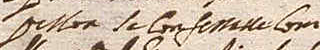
pessoa se confessasse com
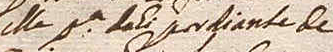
ella p.a dahi por diante de
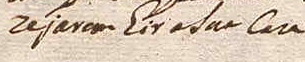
zejarem hir a sua caza.
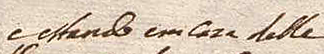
e estando em caza delle
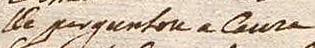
lhe perguntou a cauza
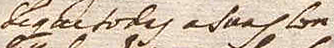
de que todas a suas con
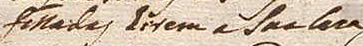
fessadas hirem a sua caza
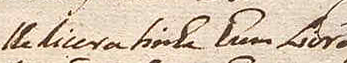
lhe dicera tinha hum Livro
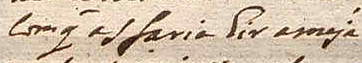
com q̄ as faria hir a meja
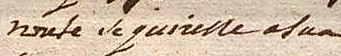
noute se quizesse a sua
